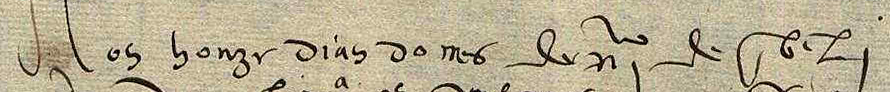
Aos honze dias do mes de nro de j̄bcLj
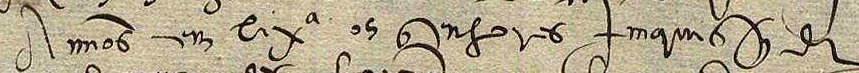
Annos em lixa os senhores Jmquisydor
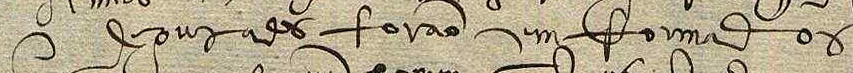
e deputados foraõ emformados
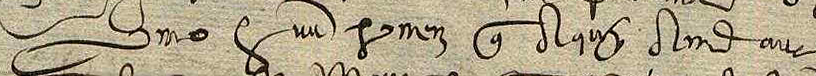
Como huū homem q̄ Aquy Amdaua
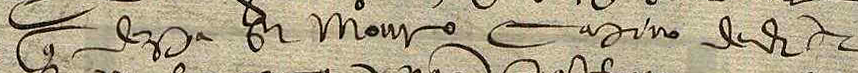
q̄ dezya ser Mouro Catiuo de drte
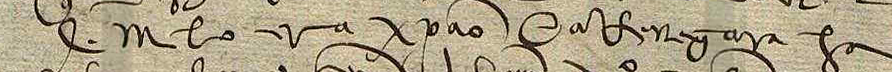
de melo era xpão e aRenegara ha
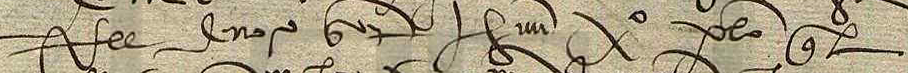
ffee de noso s̄or Jhuū Xo pl̄o q̄L
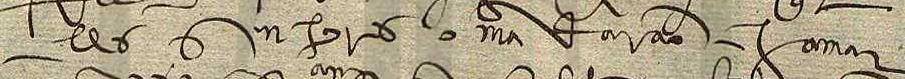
elles senhores o mādarão chamar
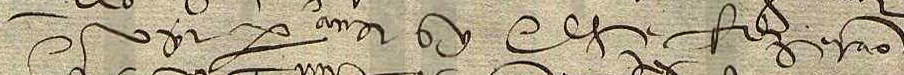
e vyr ꝑante sy e lhe fizeraõ
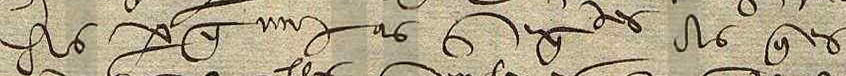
As ꝑguntas seḡtes As q̄es
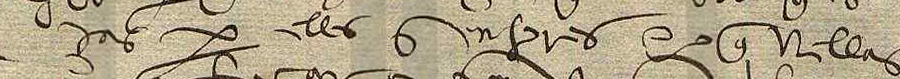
vtas ꝑ elles senhores e o q̄ nellas
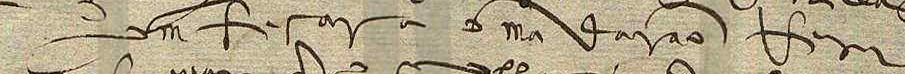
Comfesara o mādarão Reser
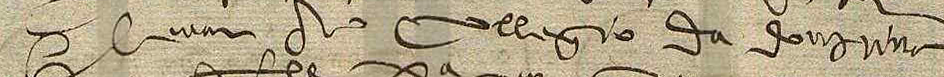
e leuar Ao Collegio da doutrina
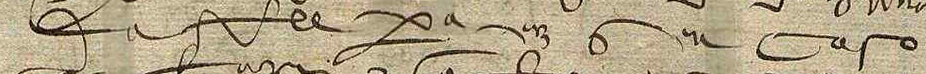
da ffee ꝑa em seu Caso
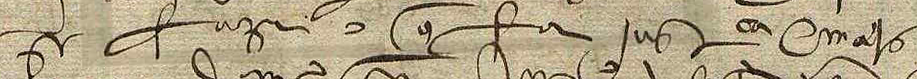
se fazer o q̄ for Justça e majs
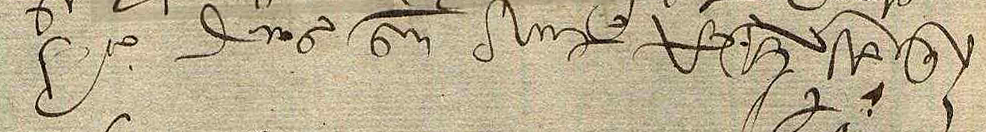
ꞩço de noso s̄or Anto Roj̄z o sp̄vy
